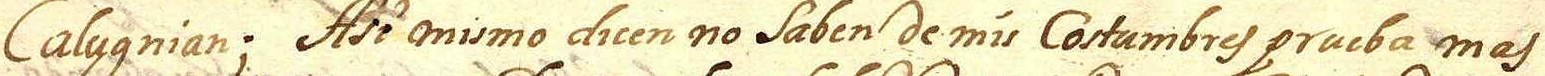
Calugnian; Asi mismo dicen no saben de mis Costumbres prueba mas
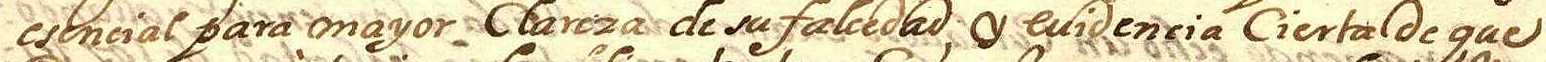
esencial para mayor Clareza de su falcedad, y euidencia Cierta de que
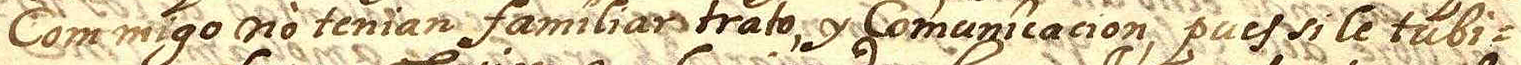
Commigo nò tenian familiar trato, y Comunicacion, pues si le tubi
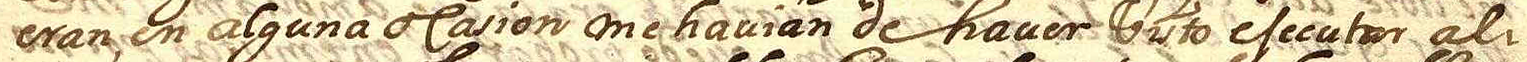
eran, en alguna oCasion me hauian de hauer visto esecutar al
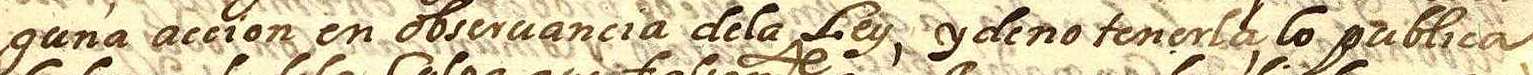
guna accion en obseruancia dela Ley, y de no tenerla, lo publica
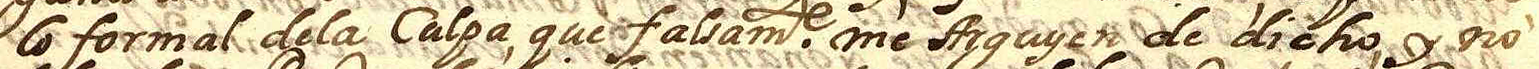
lo formal dela Culpa, que falsam.te me Arguyen de dicho y nò
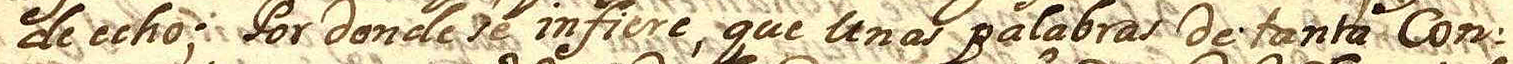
de echo; Por donde se infiere, que Unas palabras de tanta con
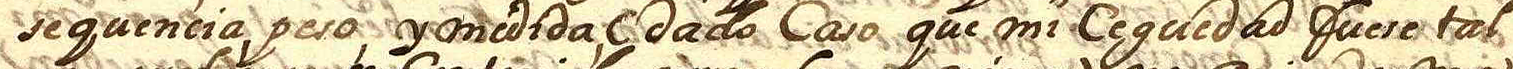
sequencia, peso, y medida, (dado Caso que mi Ceguedad fuese tal
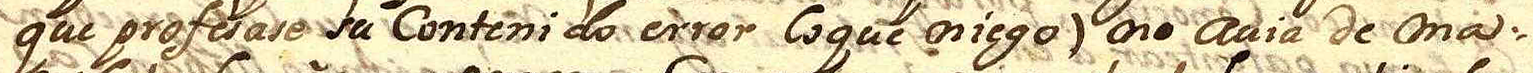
que profesase su Contenido error lo que niego) no auia de ma
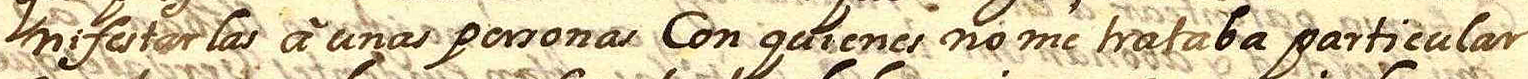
nifestarlas á unas personas Con quienes no me trataba particular
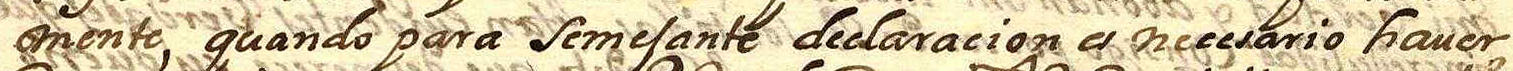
mente, quando para semejante declaracion es necesario hauer
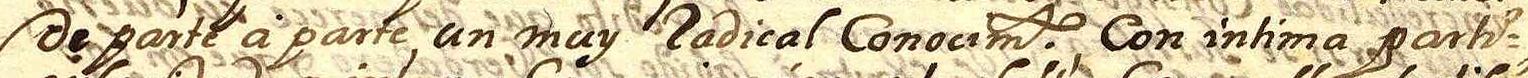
de parte a parte, un muy Radical Conocim.to, Con intima parti
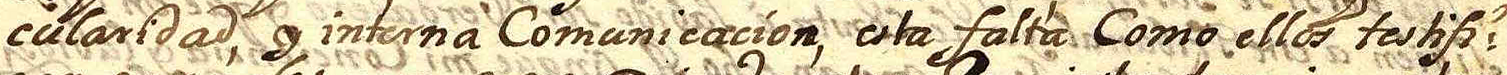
cularidad, y interna Comunicacíon, esta falta Como ellos testifi
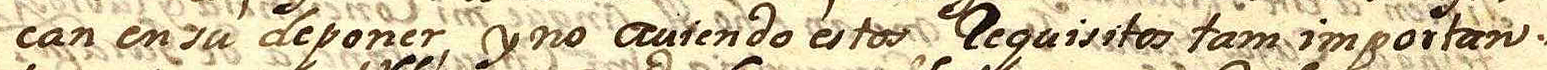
can en su deponer, y no auiendo estos Requisitos tam importan
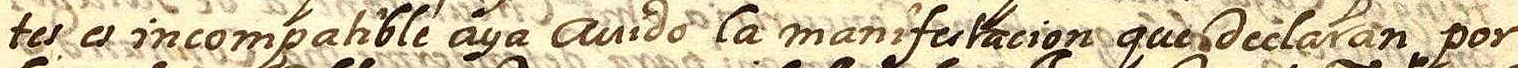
tes e incompahible aya auido la manifestacion que declaran por
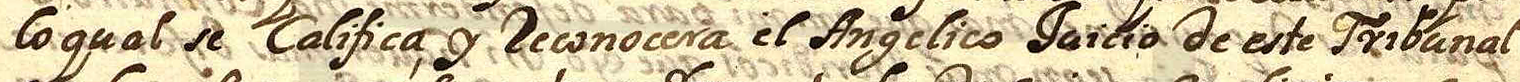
lo qual se Califica, y Reconocera il Angelico Iuicio de este Tribunal
